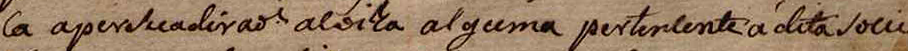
ca apersuadiraõ a coiza alguma pertencente á dita socie
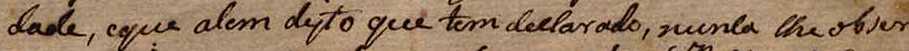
dade, e que alem disto que tem declarado, nunca lhe obser
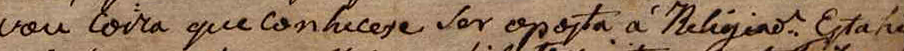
vou coiza que conhecese ser oposta á Religiaõ. Esta hé
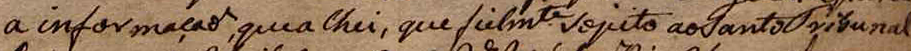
a informaçaõ que achei, que fielm.te sojeito ao Santo Tribunal
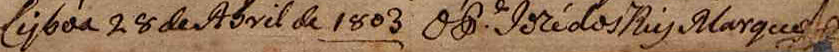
Lisboa 28 de Abril de 1803. O P.e José dos Reis Morgado
